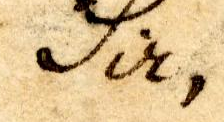Sir,
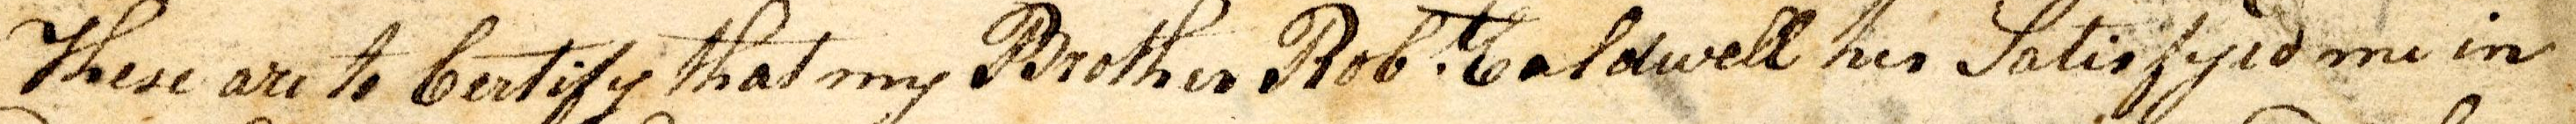These are to Certify that my Brother Rob^t. Caldwell his satisfyed me in
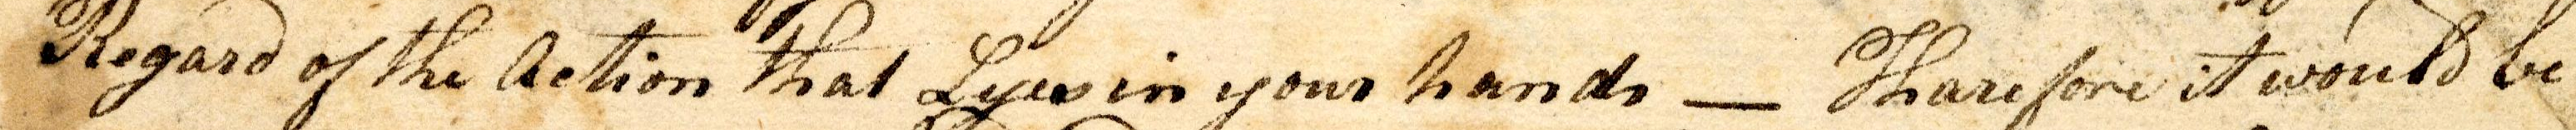Regard of the Action that Lyes in your hands. Therefore it would be
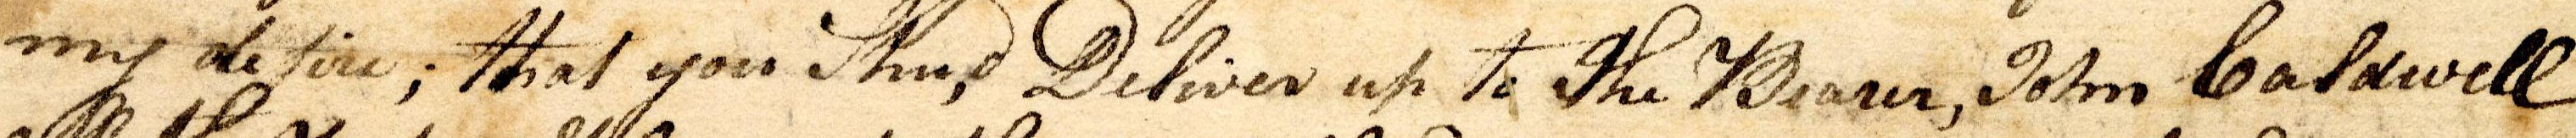my desire; that you Shu'd Deliver up to the Bearer, John Caldwell
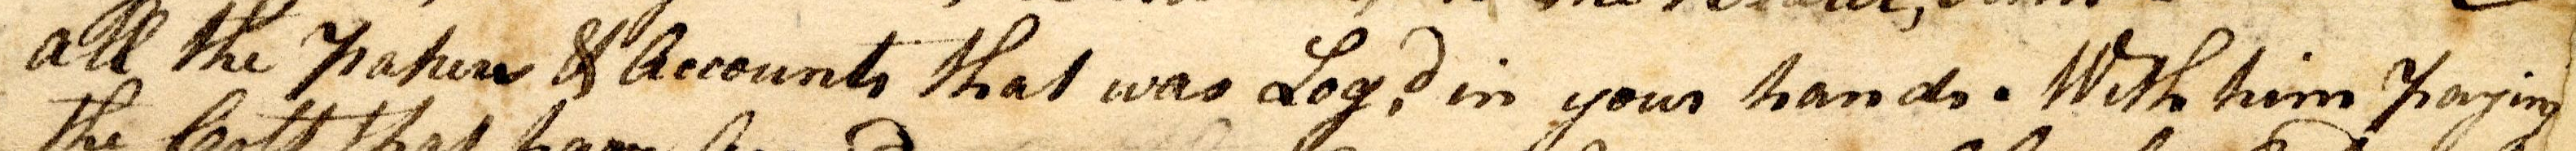all the papers & Accounts that was Log'd in your hands. With him paying
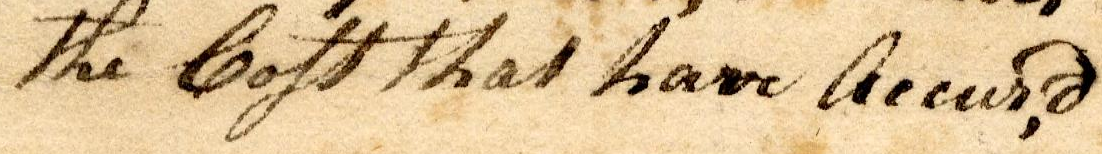the Cost that have Accur'd
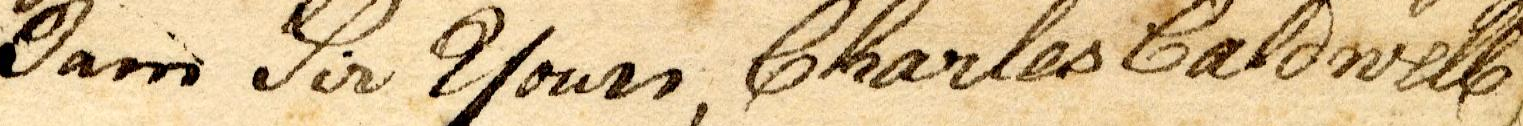I am Sir Yours, Charles Caldwell
